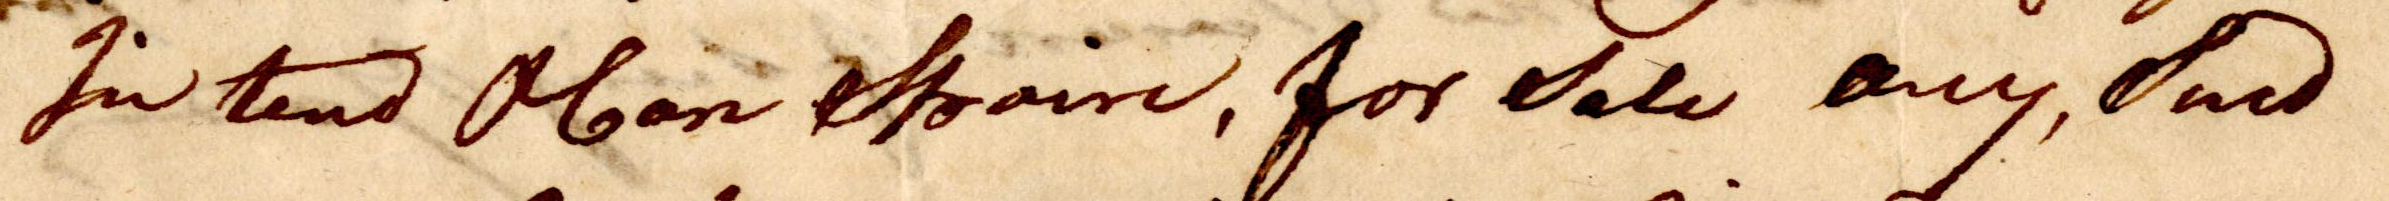In tend & Can Share, for Sale any, Surd
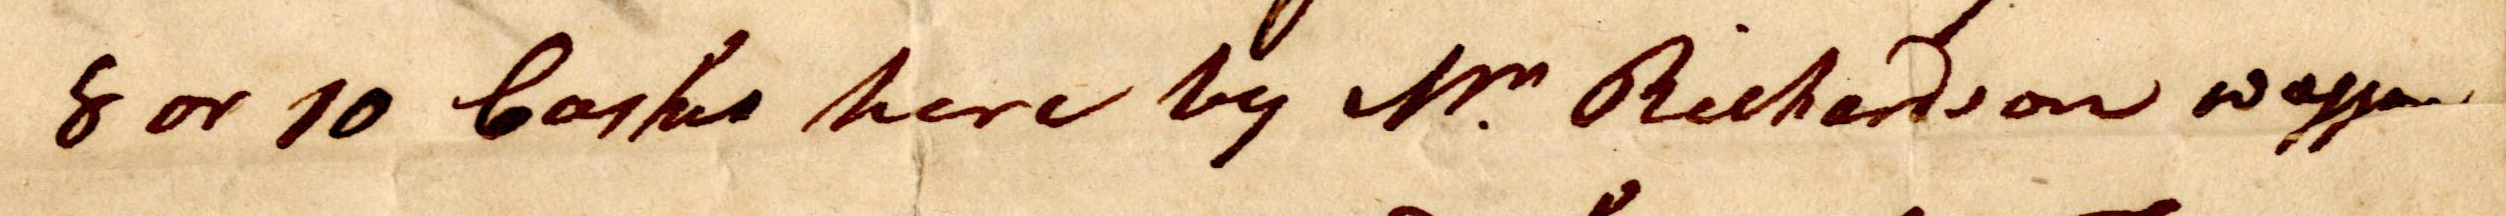8 or 10 Cashs here by M^r. Richardson Wagge
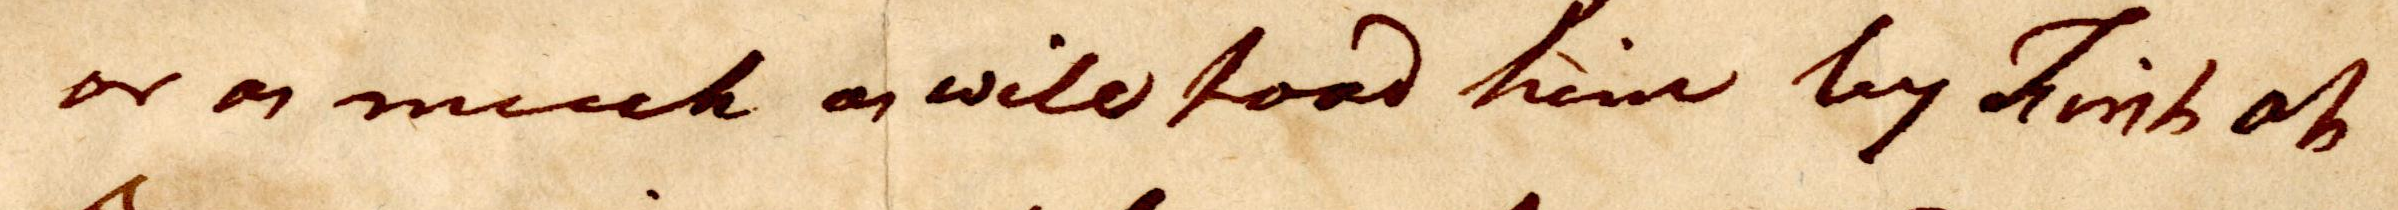or as much as will Load him by First of
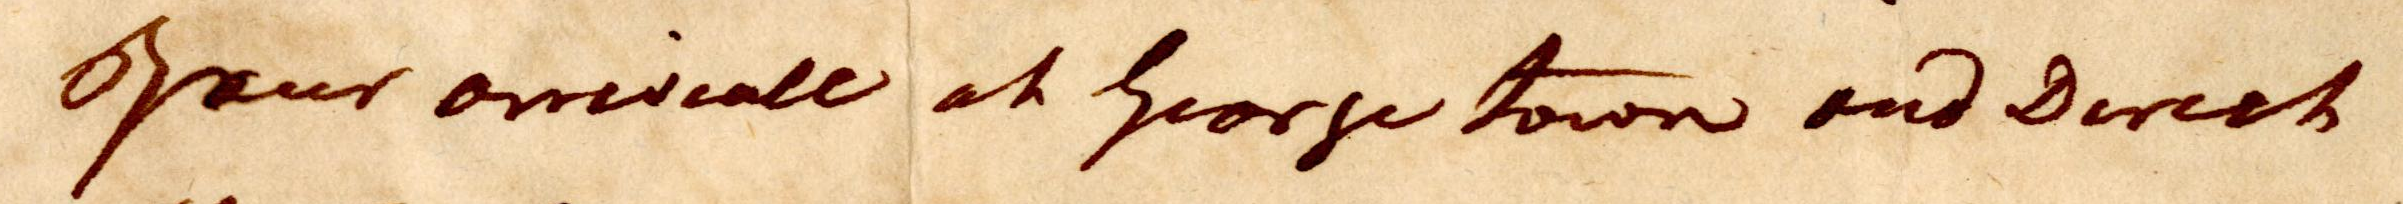your arrival at Georgetown and Direct
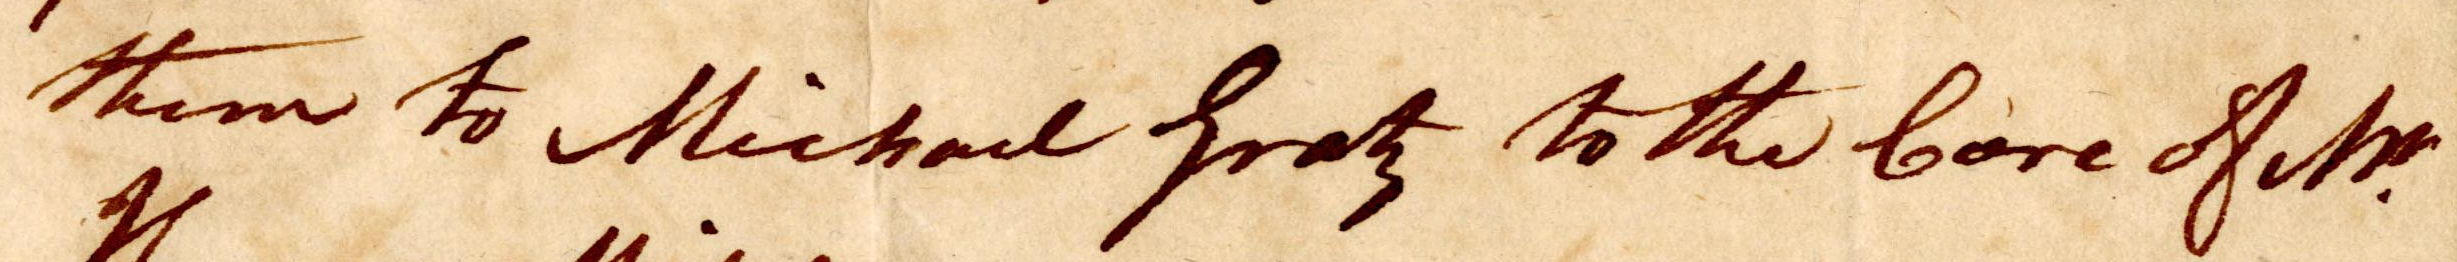them to Michael Gratz, to the Care of M^r.
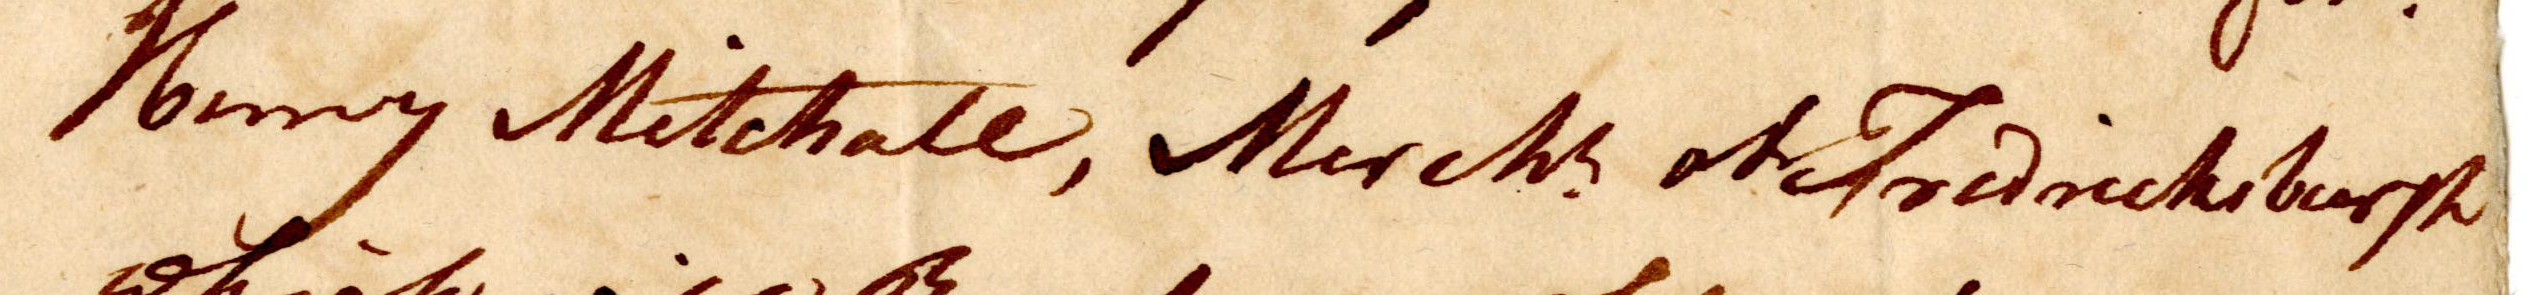Henry Mitchell, Merch^t at Fredericksburgh
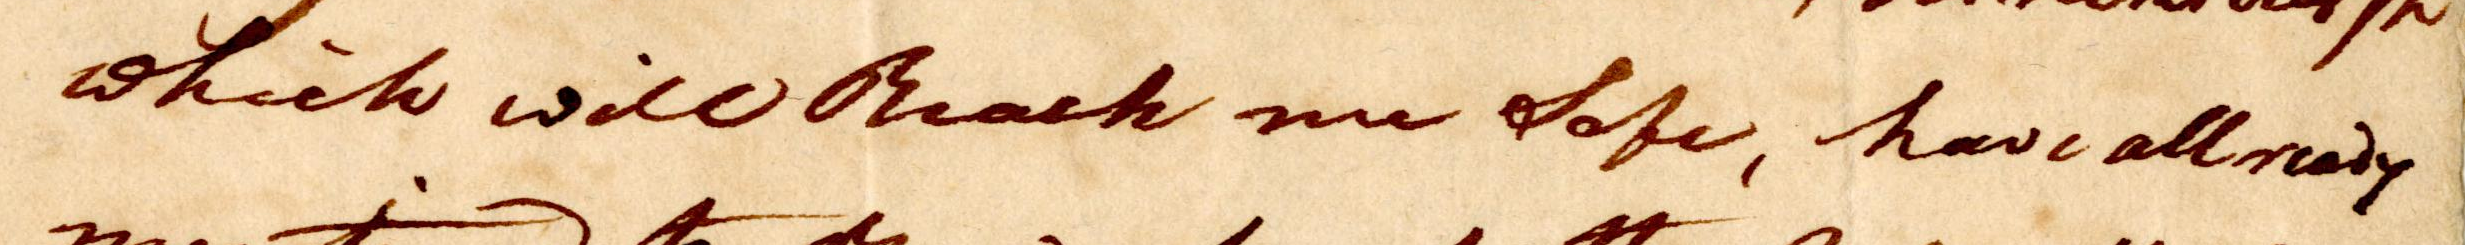which will Reach me Safe, have allready
